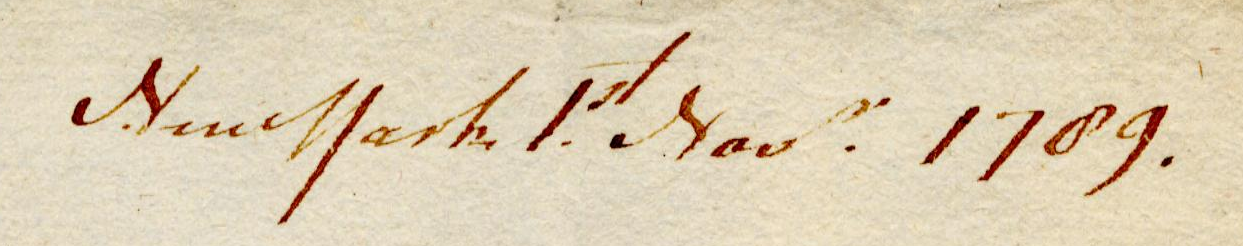New York 1^st. Nov^r. 1789.
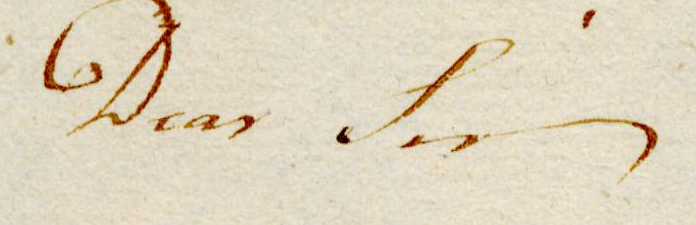Dear Sir
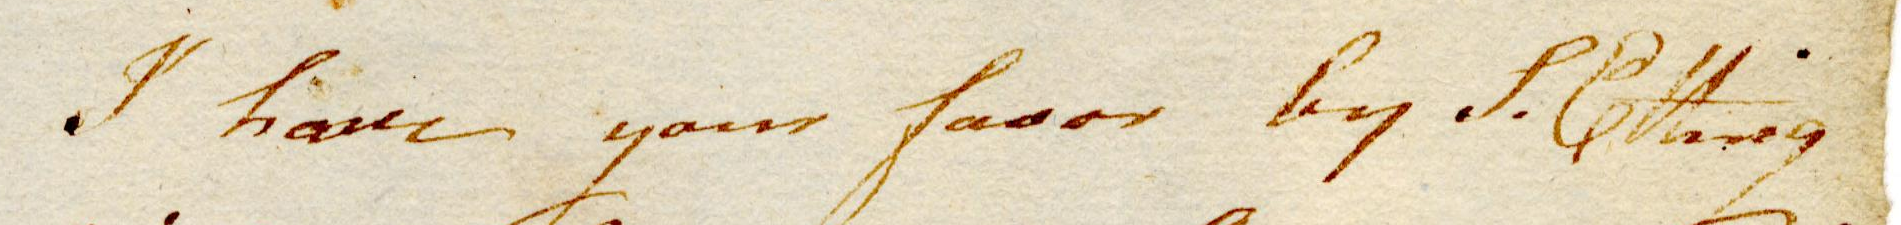I have your favor by S. Elling
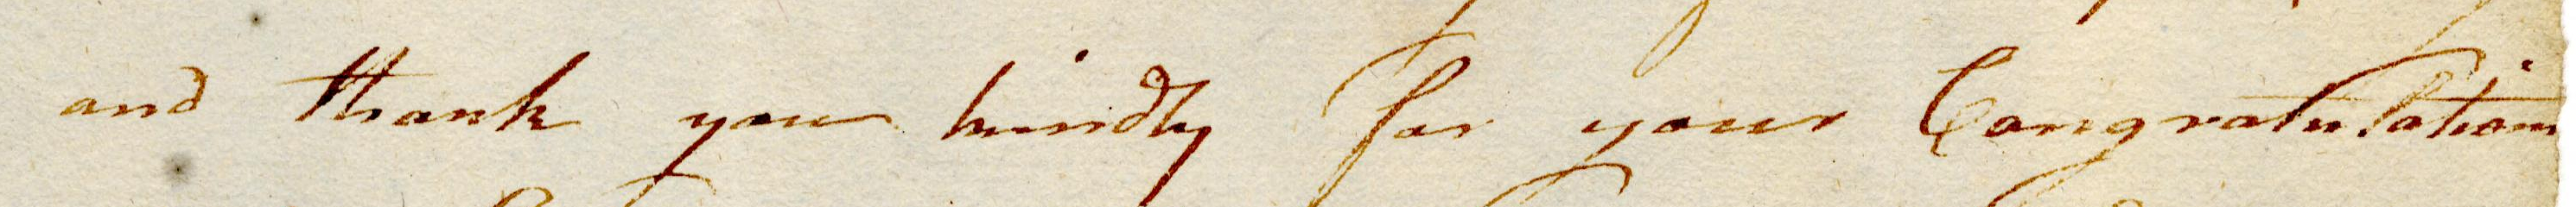and thank you kindly for your Congratulations
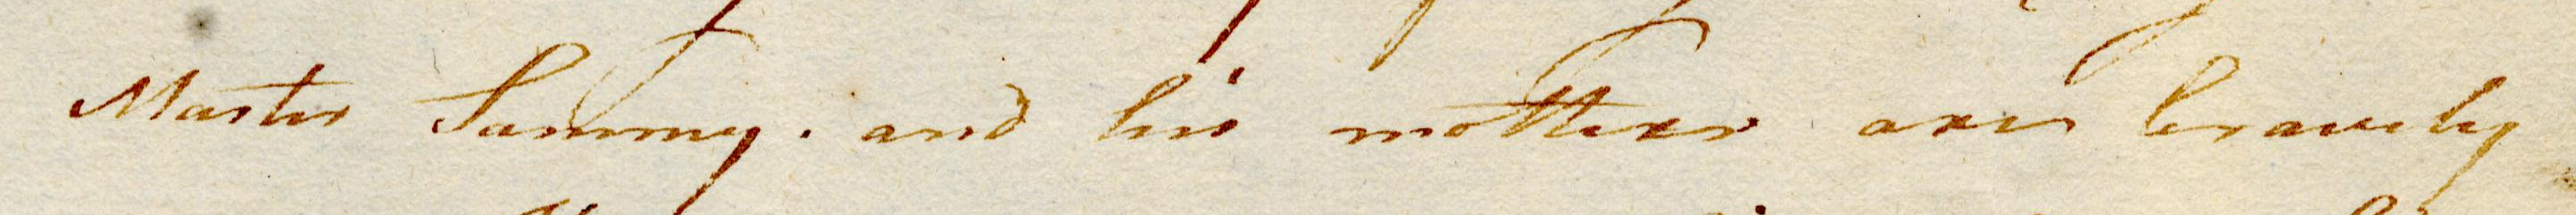Master Sammy and his mother are bravely
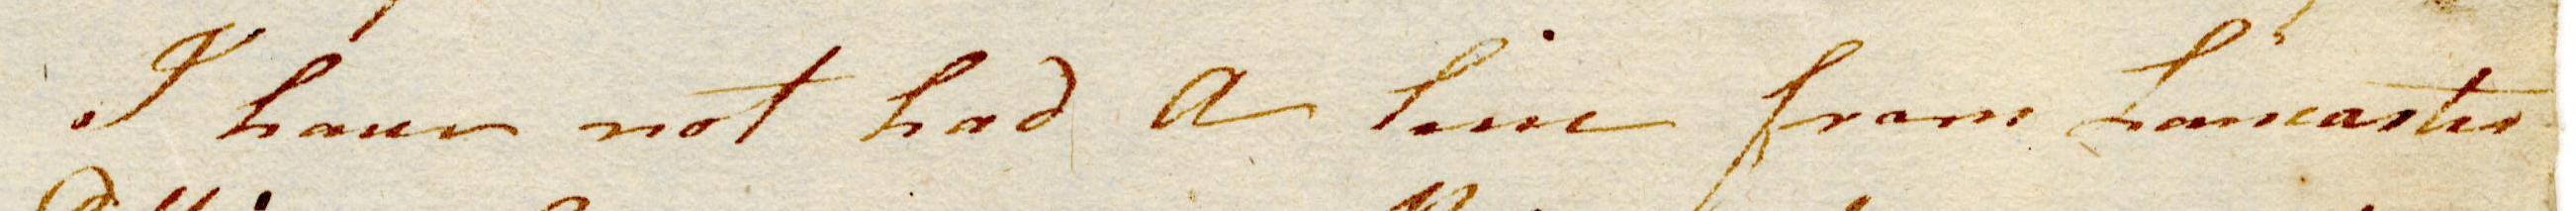I have not had a line from Lancaster
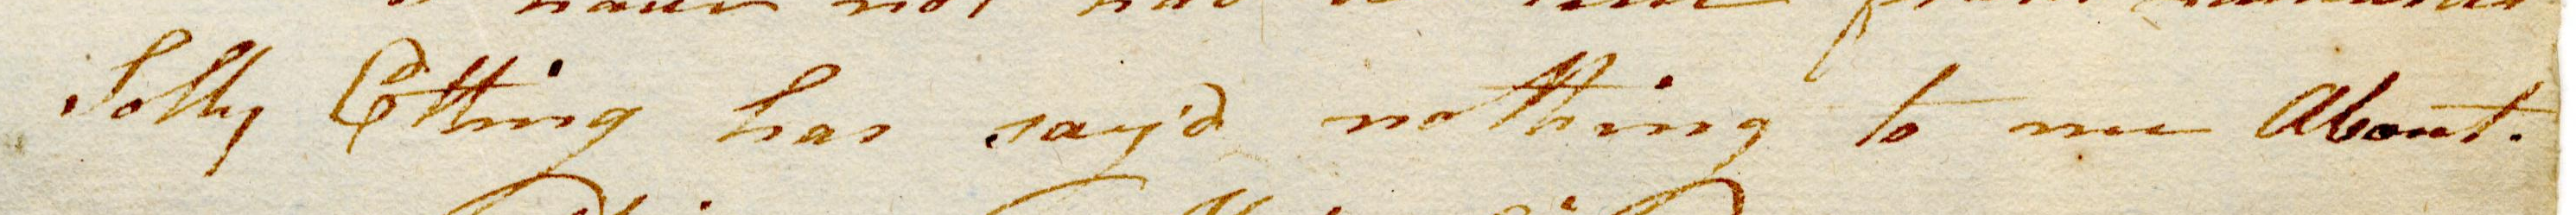Solly Etting has say'd nothing to me About.
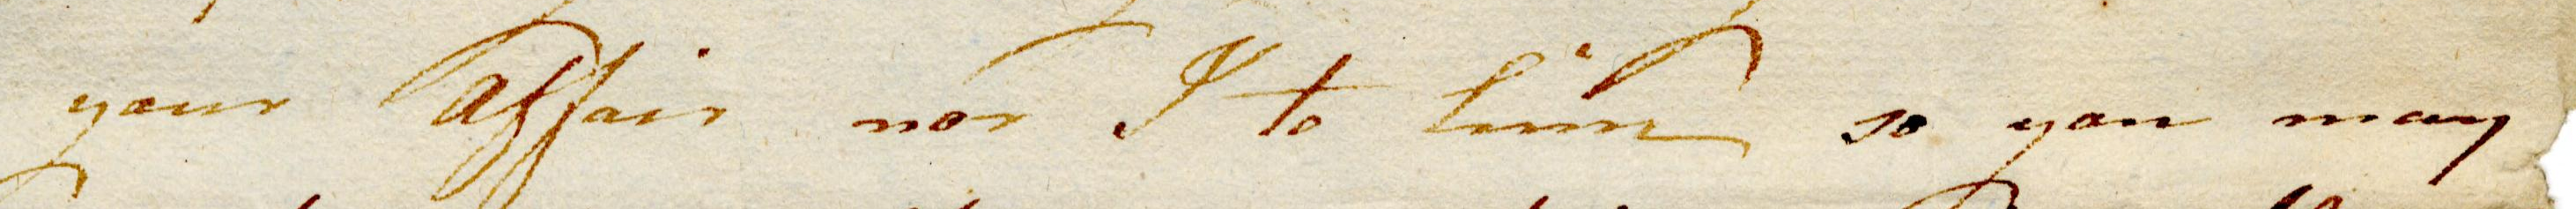your affairs nor I to him so you may
